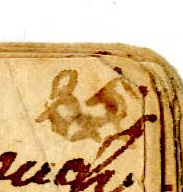25
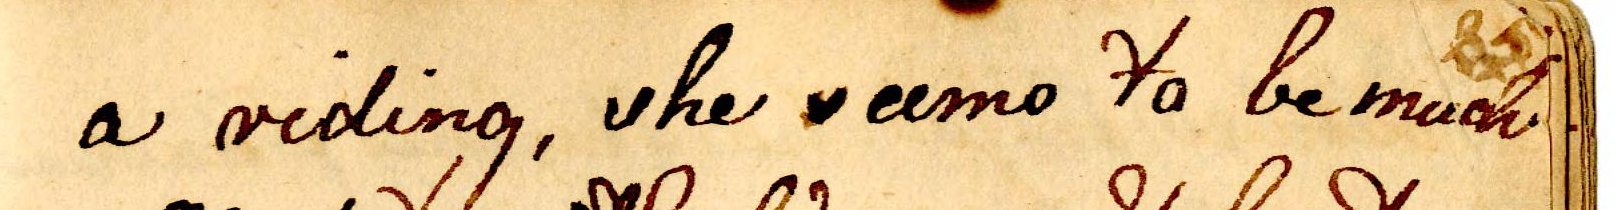a riding, she seems to be much
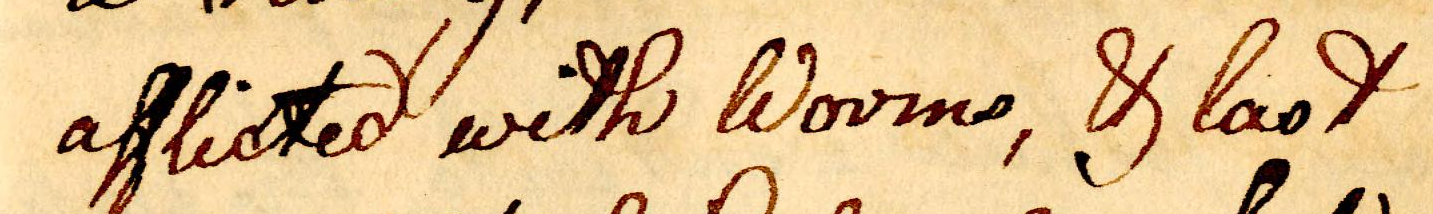afflicted with Worms, & last
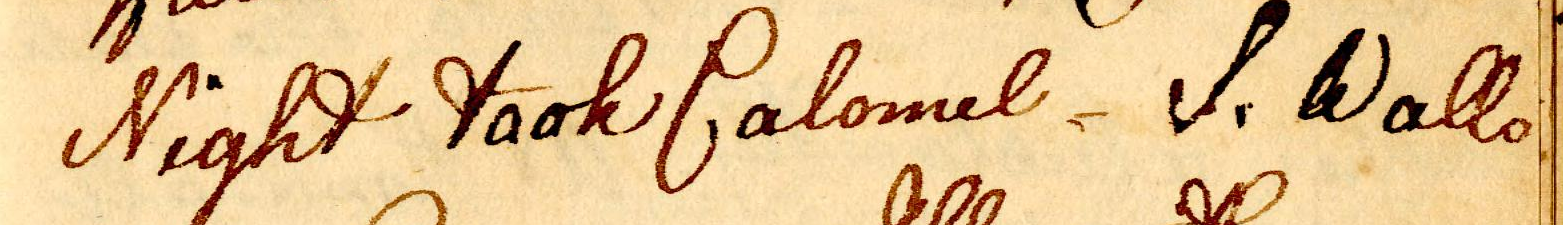Night took Calomel- S. Walls
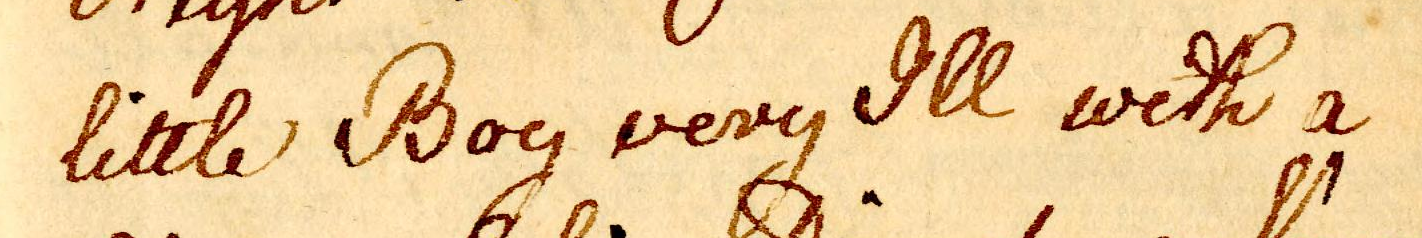little Boy very Ill with a
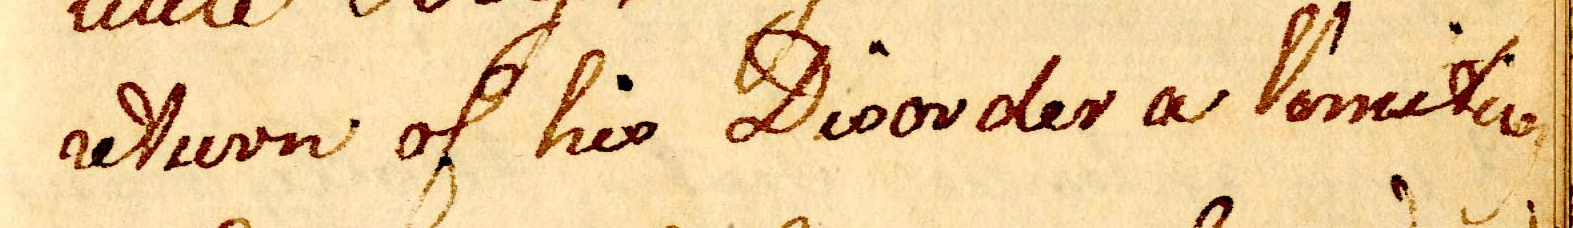return of his Disorder a Vomiting
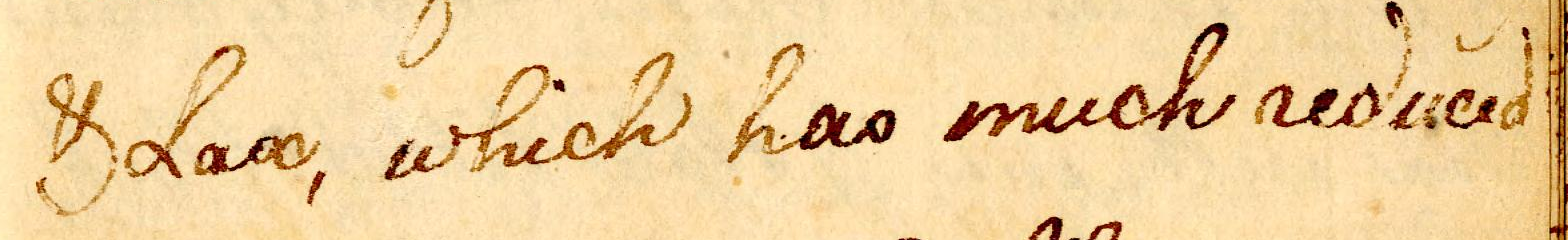& Lax, which has much reduced
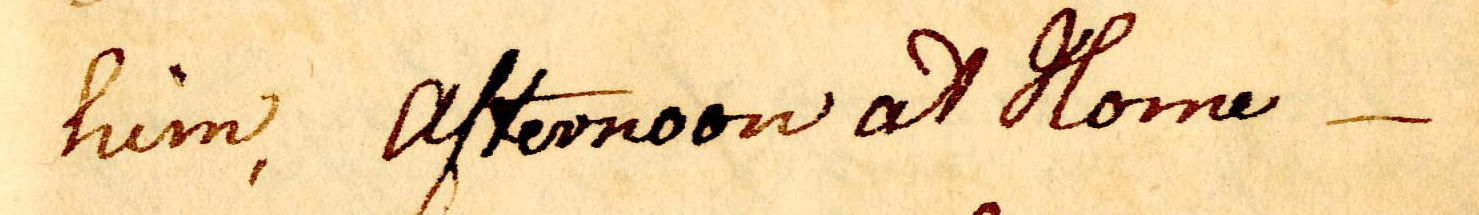him, Afternoon at Home-
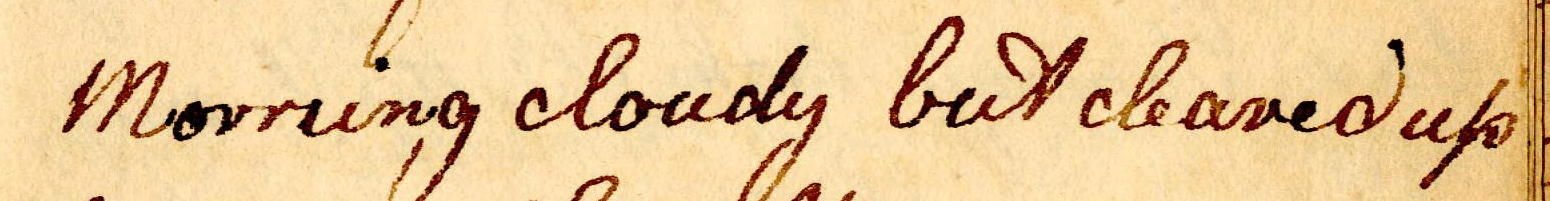Morning cloudy but cleared up
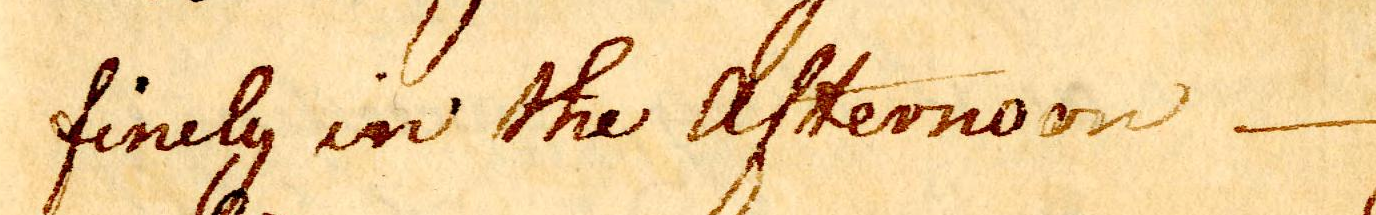finely in the Afternoon-
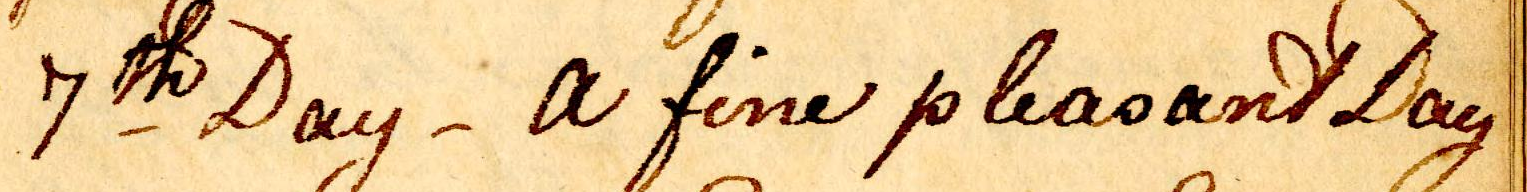7^th Day- a fine pleasant Day
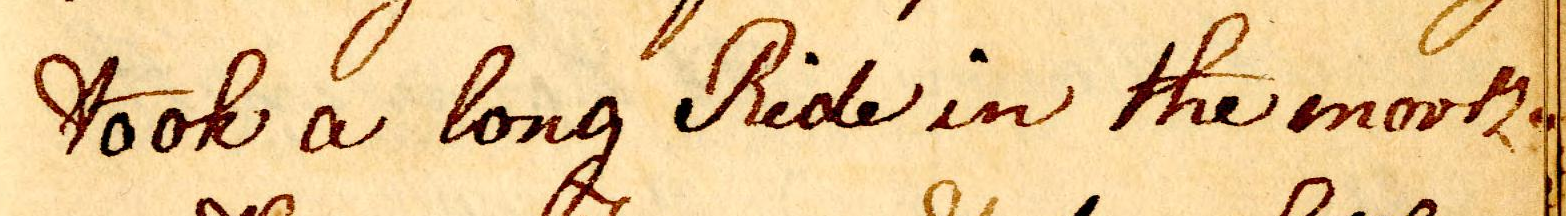took a long Ride in the mor^g
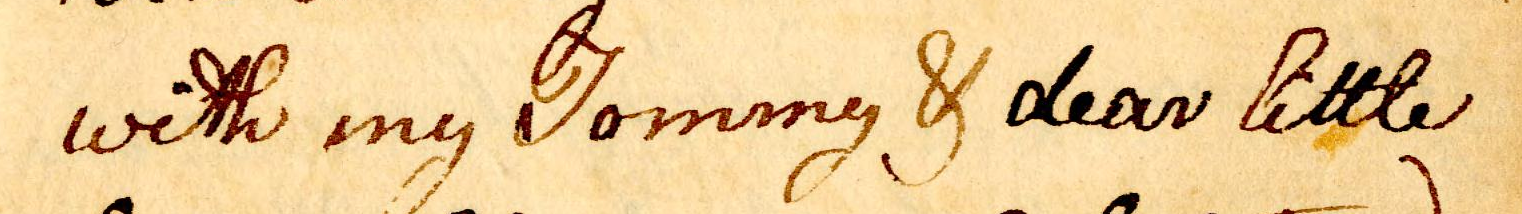with my Tommy & dear little
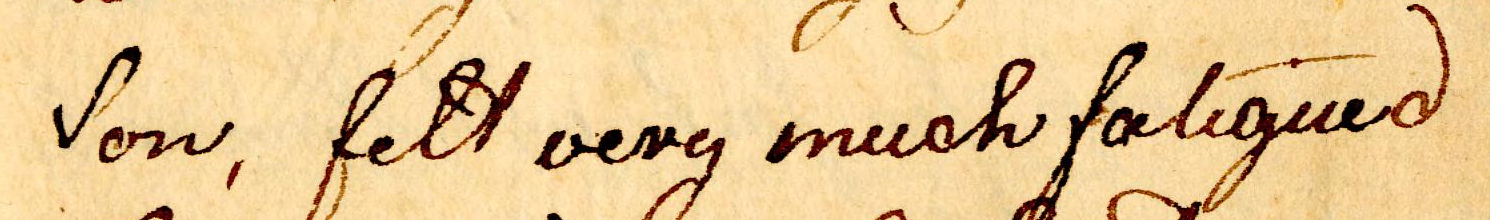Son, felt very much fatigued
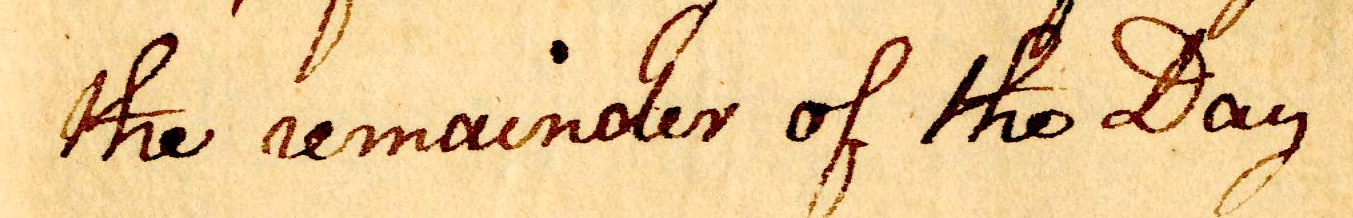the remainder of the Day
